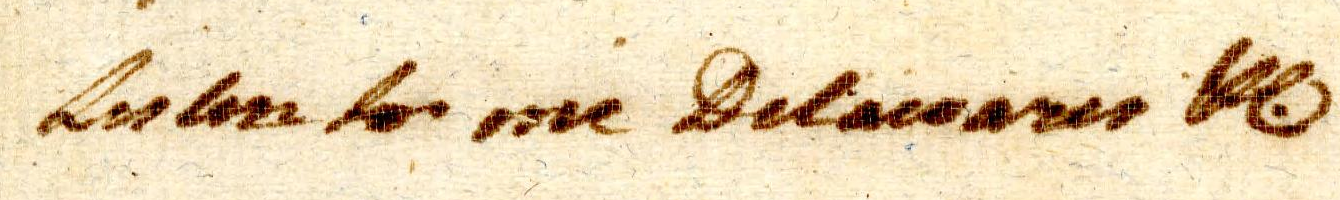Listen to me Delawares &c
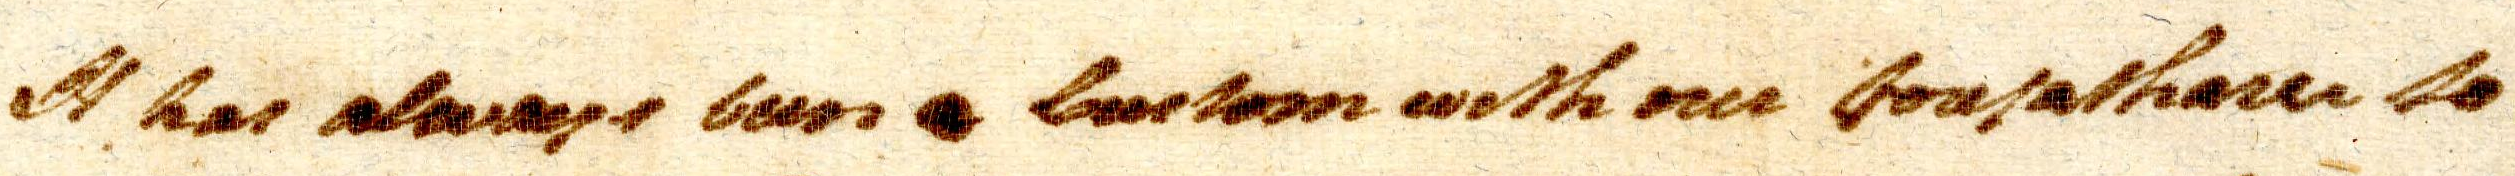It has always been a Custom with our forefathers to
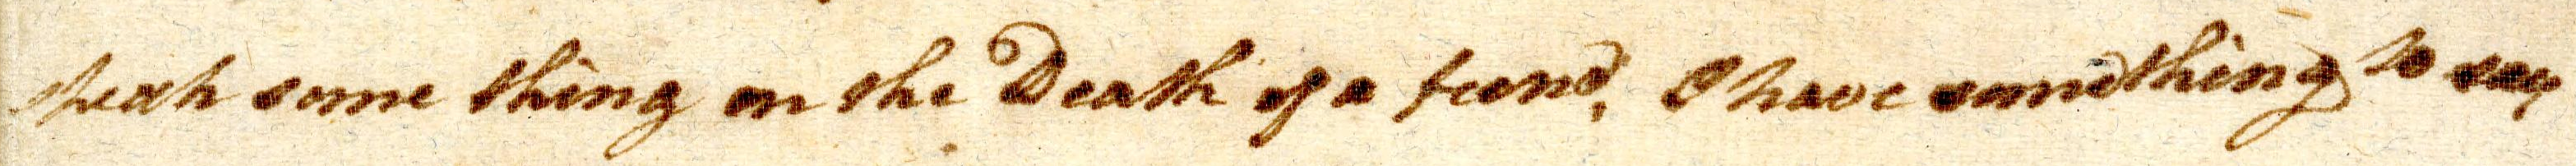speak some thing on the Death of a friend, I have something to say
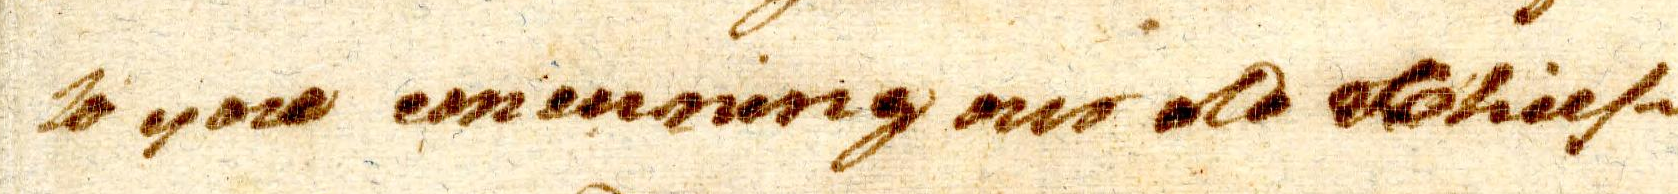to you concerning our old Chief-
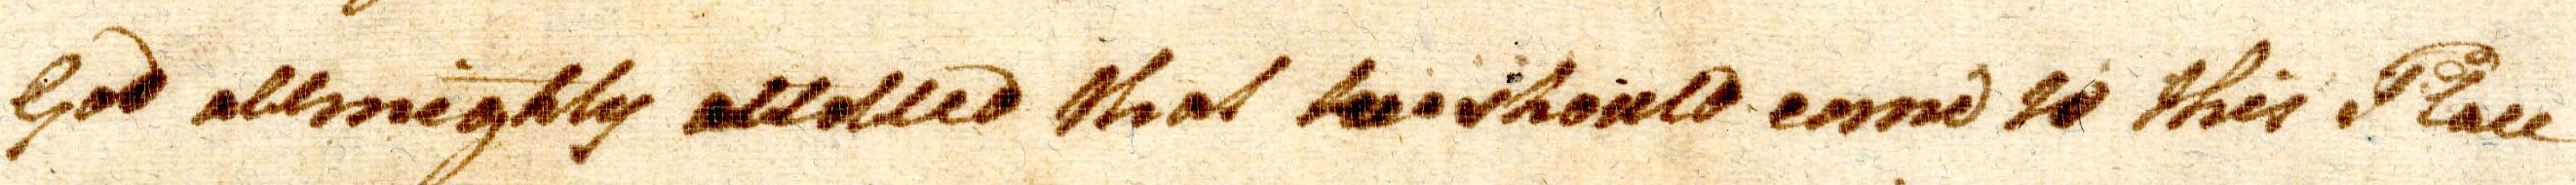God allmighty allowed that we should come to this Place
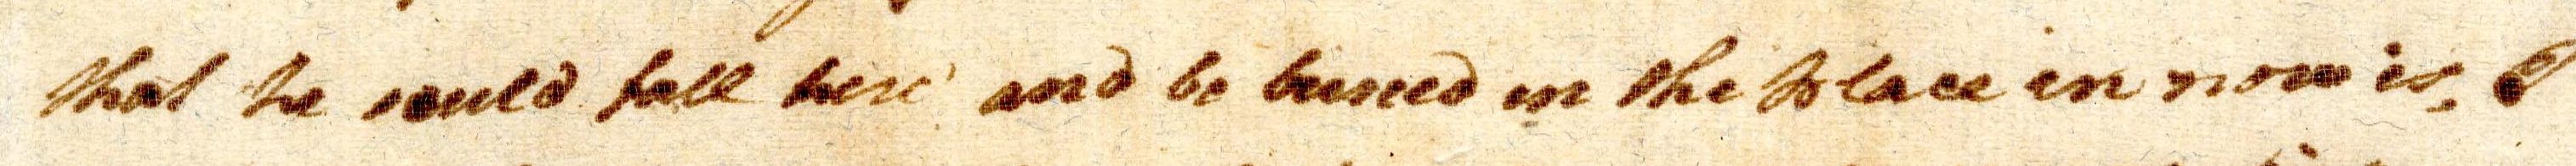that he could fall here and be buried on the Place in now is, &
